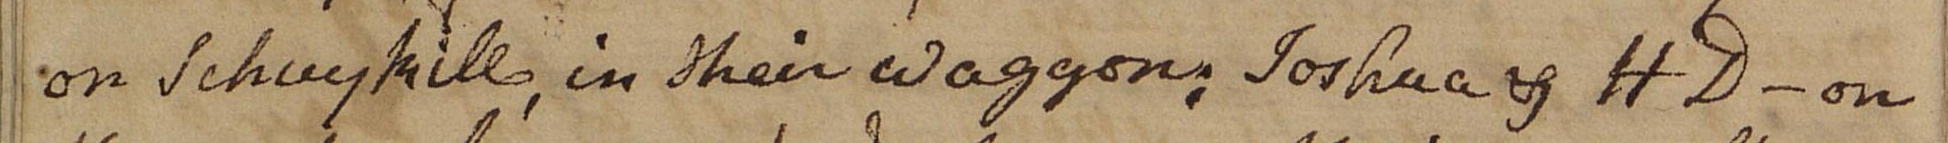on Schuykill, in their waggon: Joshua & HD- on
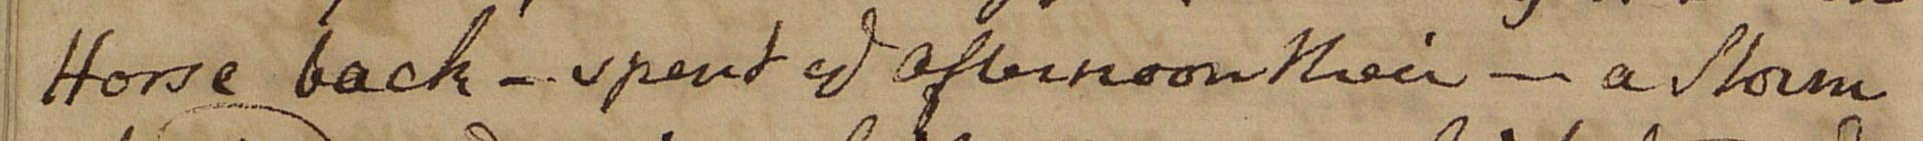Horse back- spent y^e afternoon their- a Storm
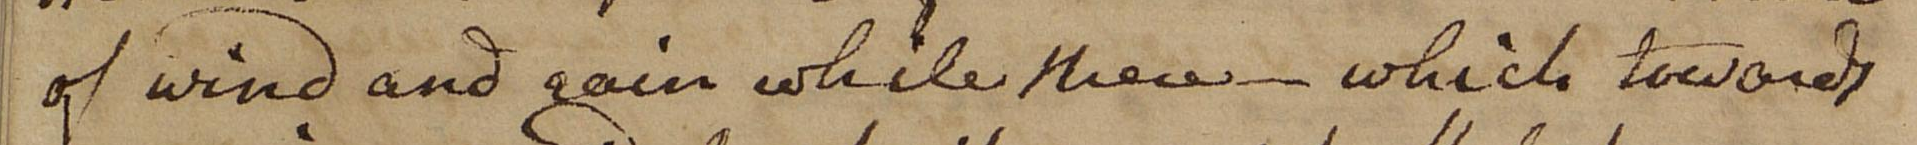of wind and rain while there- which towards
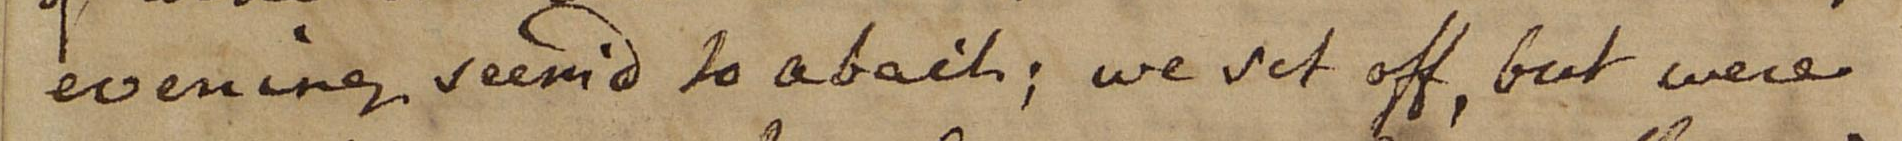evening seem'd to abait; we set off, but were
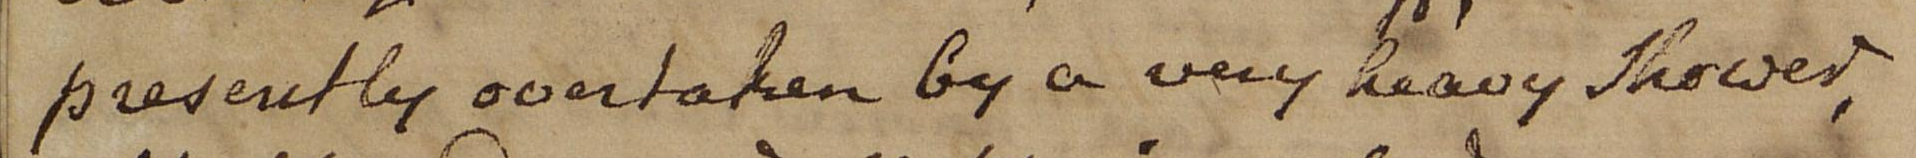presently overtaken by a very heavy Shower,
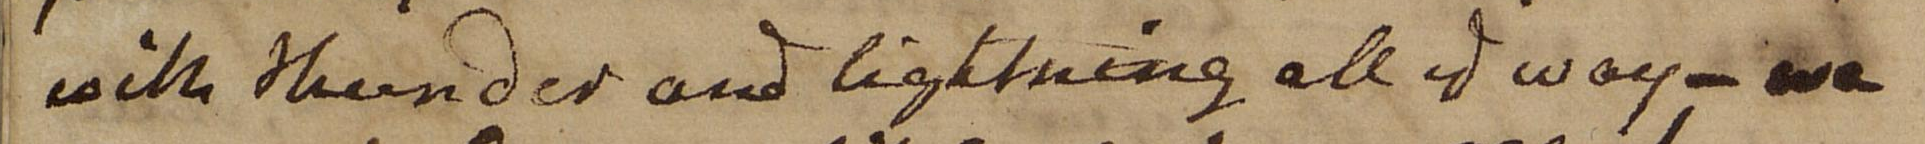will thunder and lightning all y^e way- we
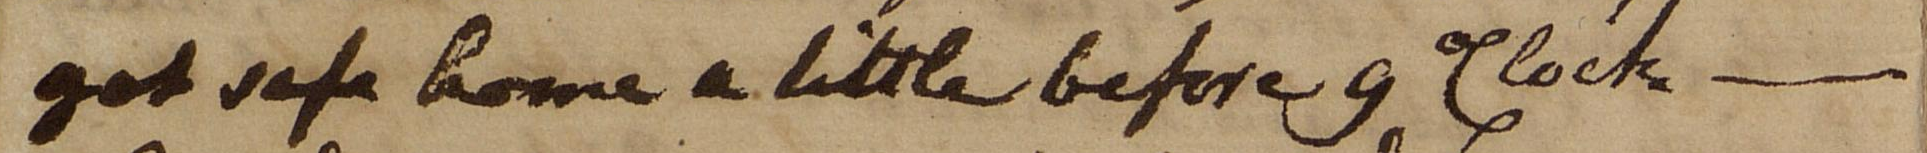got safe home a little before 9 ^oClock-
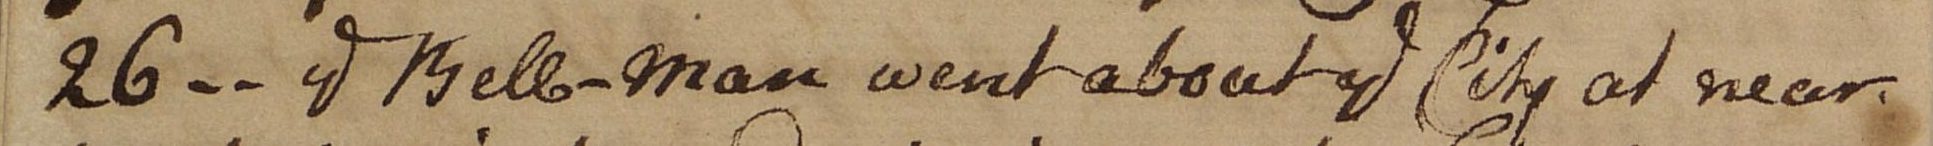26-- y^e Bell-Man went about y^e City at near,
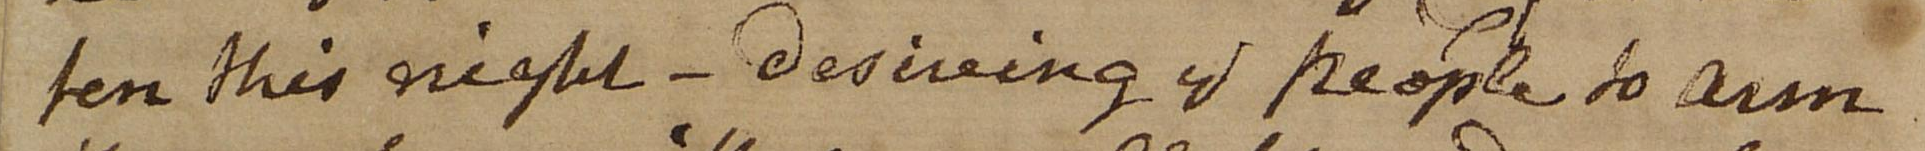ten this night- desiring y^e people to arm
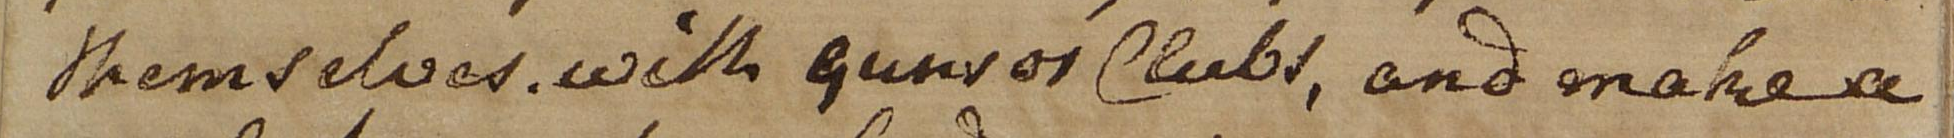themselves. with Guns or Clubs, and make a
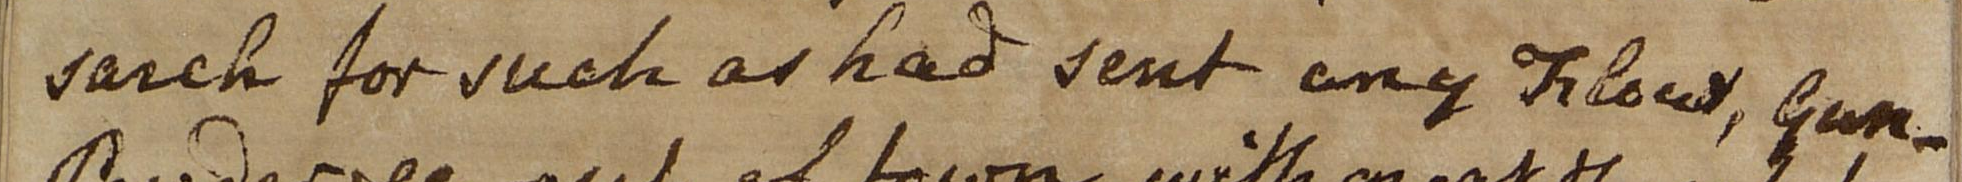sarch for such as had sent any Flour, Gun-
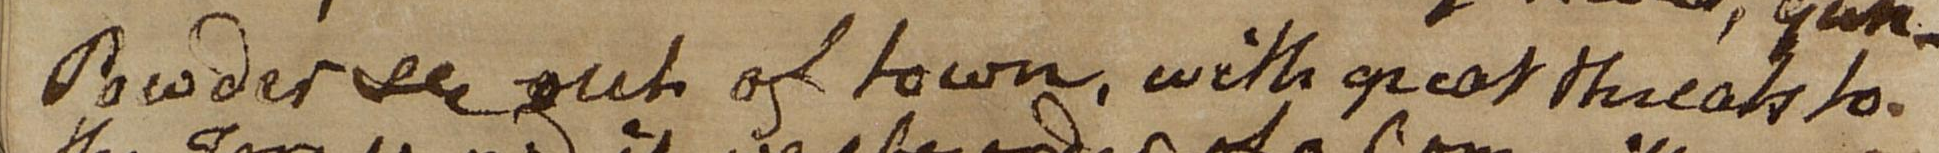Powder &c out of town, with great threats to
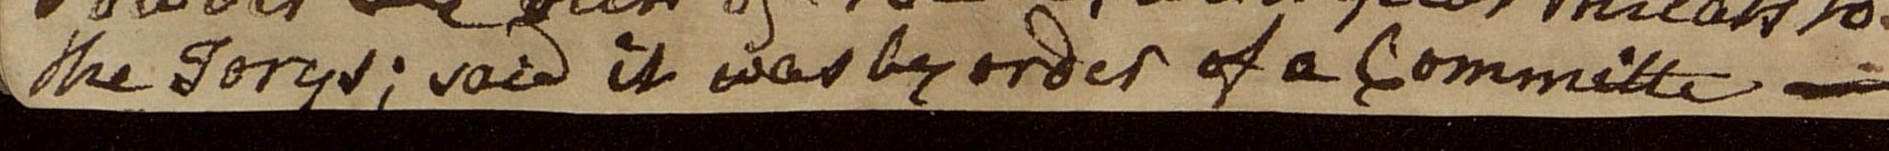the Torys; said it was by order of a Committe-
